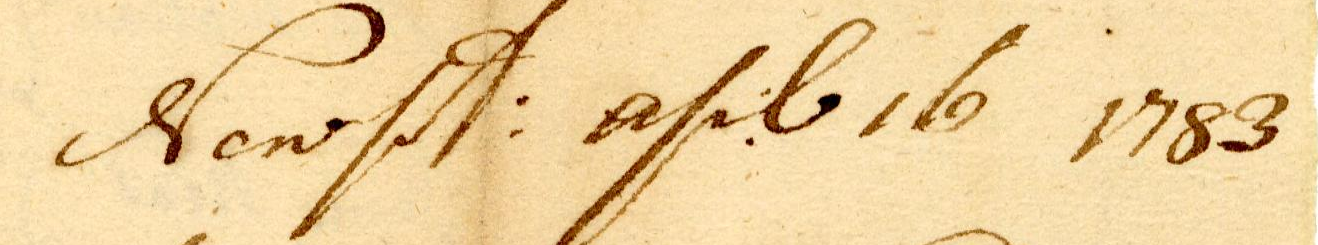Newp^t: apl 16 1783
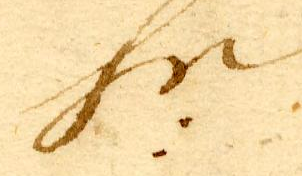S^r:
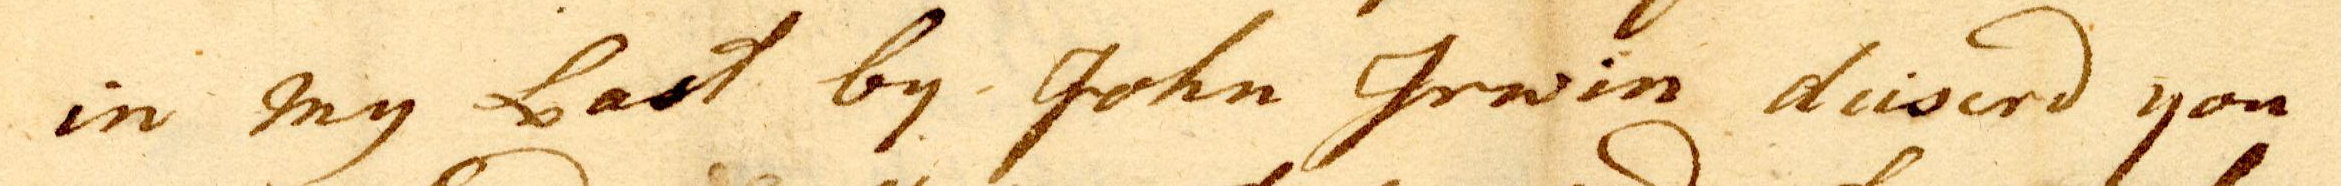in my Last by John Irwin desird you
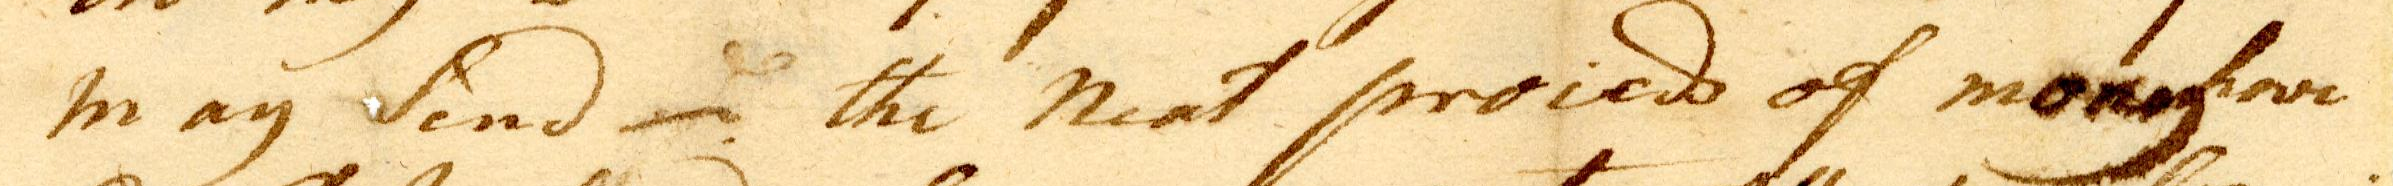may send the next proceeds of money have
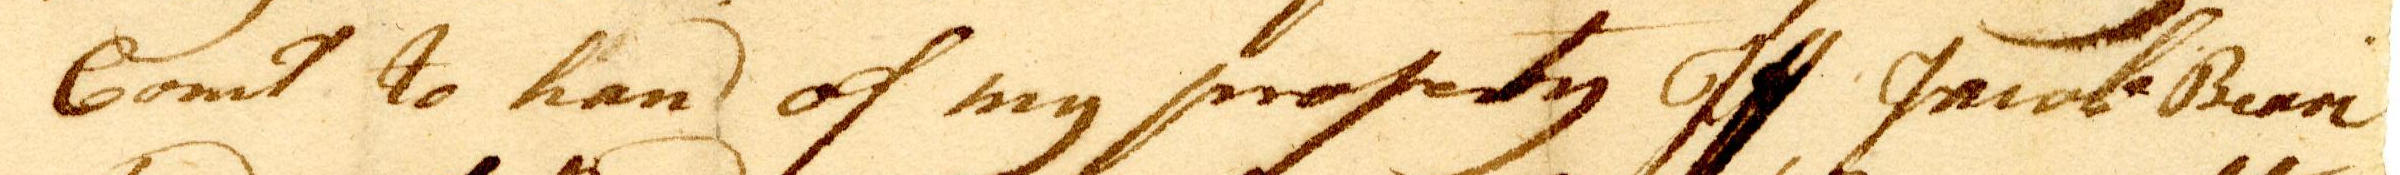Com^t to hand of my property per Jacob Bean
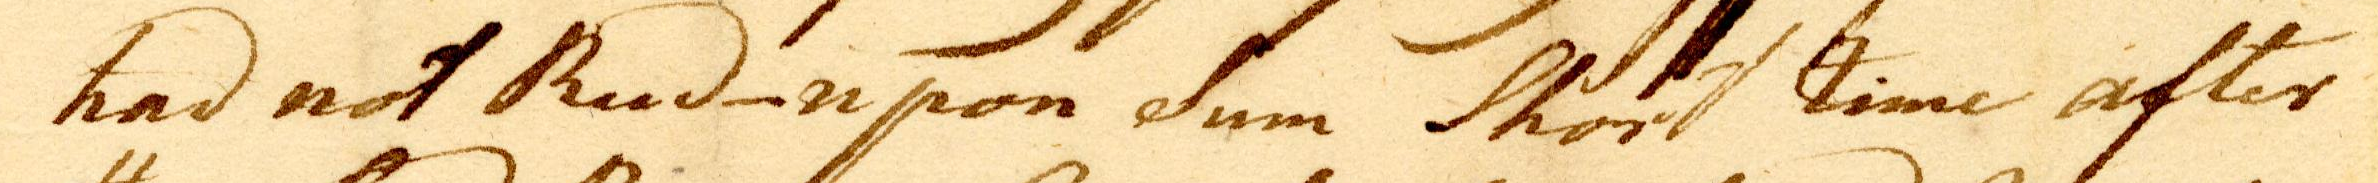had not Read-upon Sum Short time after
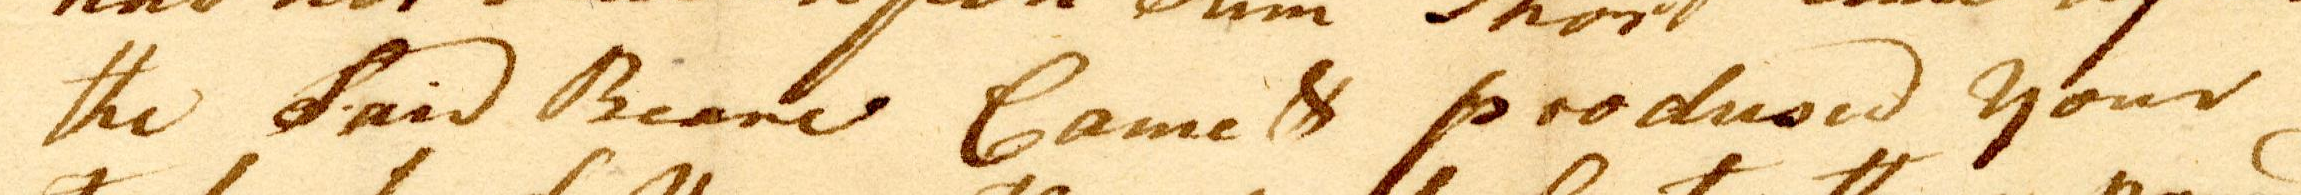the Said Beane Came & prodused your
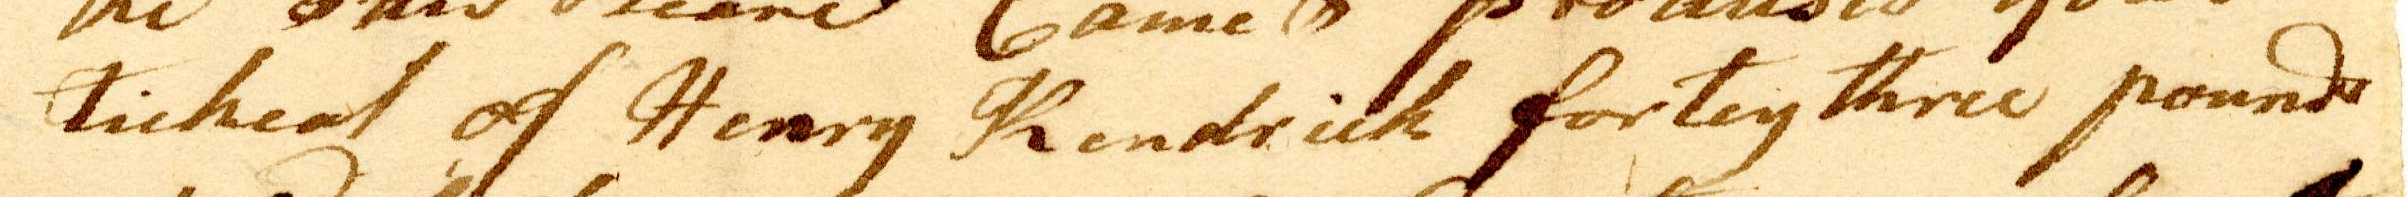ticket of Henry Kendrick fortey three pounds
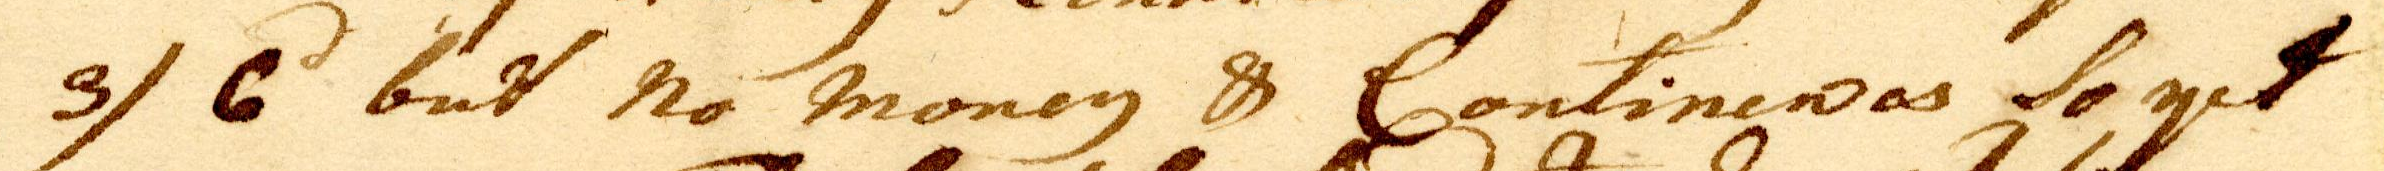3/ 6^d but No money & Contine was So yet
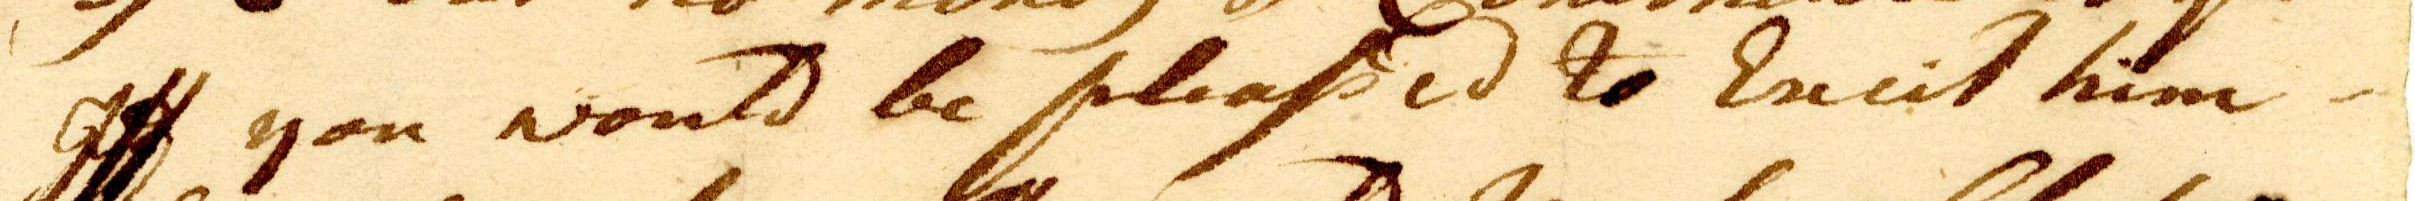Iff you would be pleassed to Encit him-
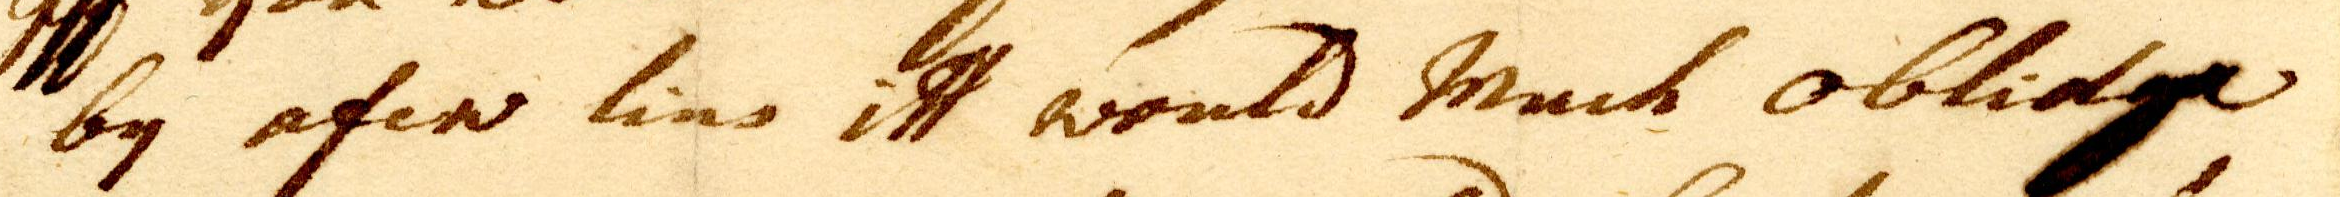by a few lins itt would much oblidge
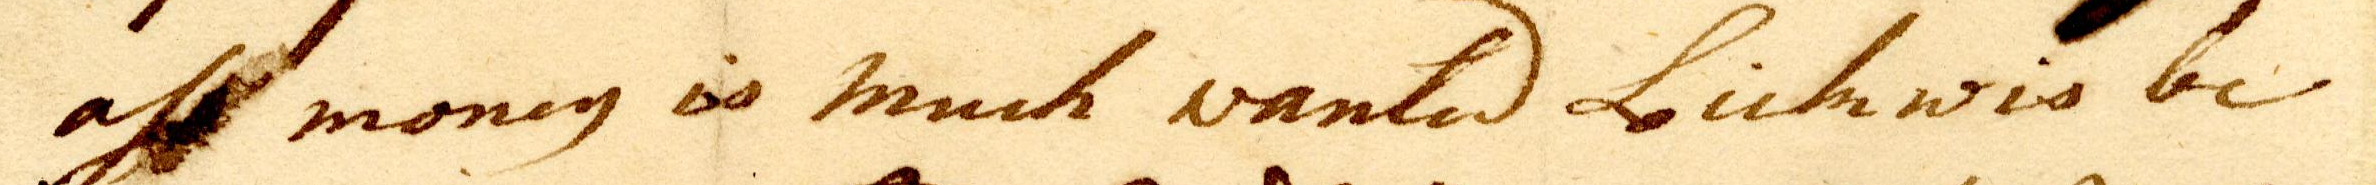as money is much wanted Likewis be
